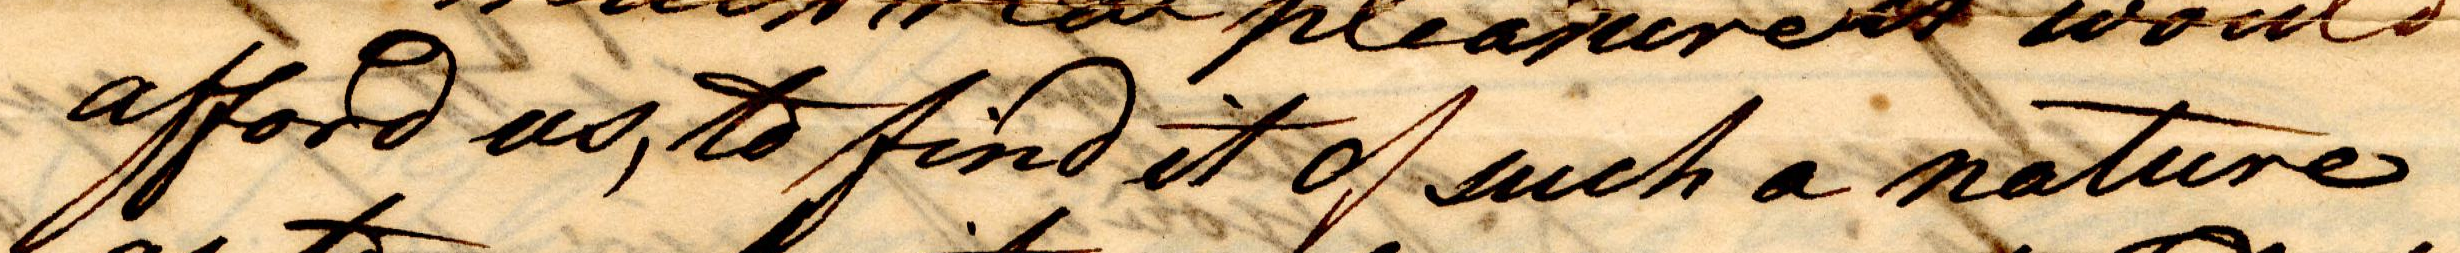afford us, to find it of such a nature
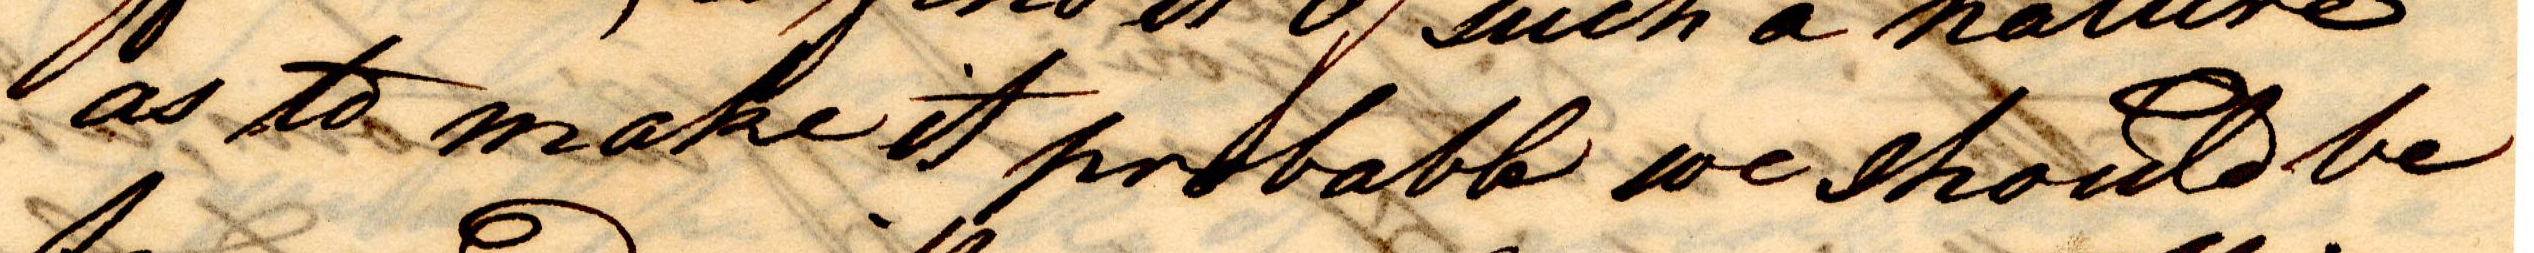as to make it probable we should be
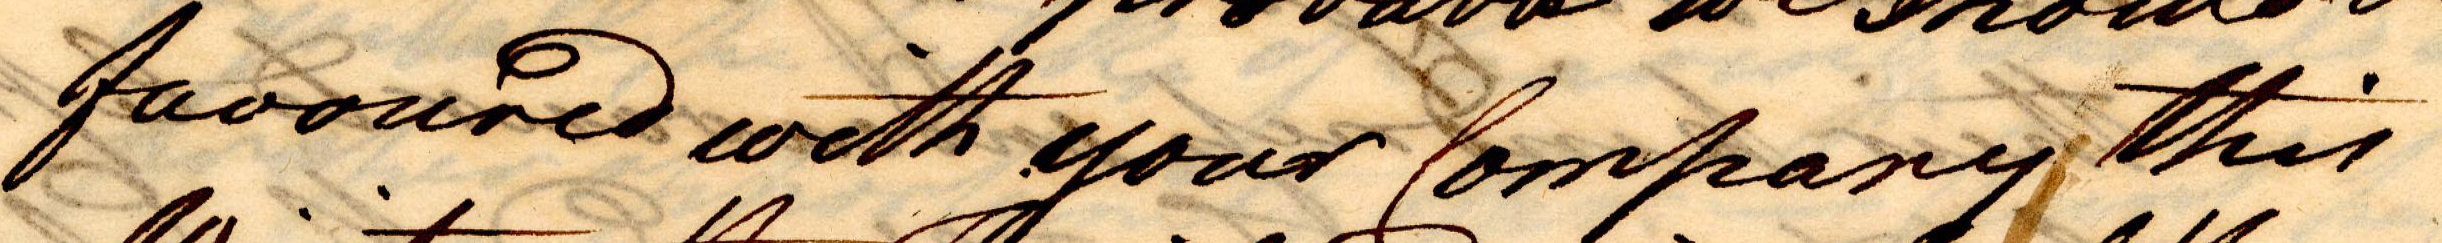favoured with your Company this
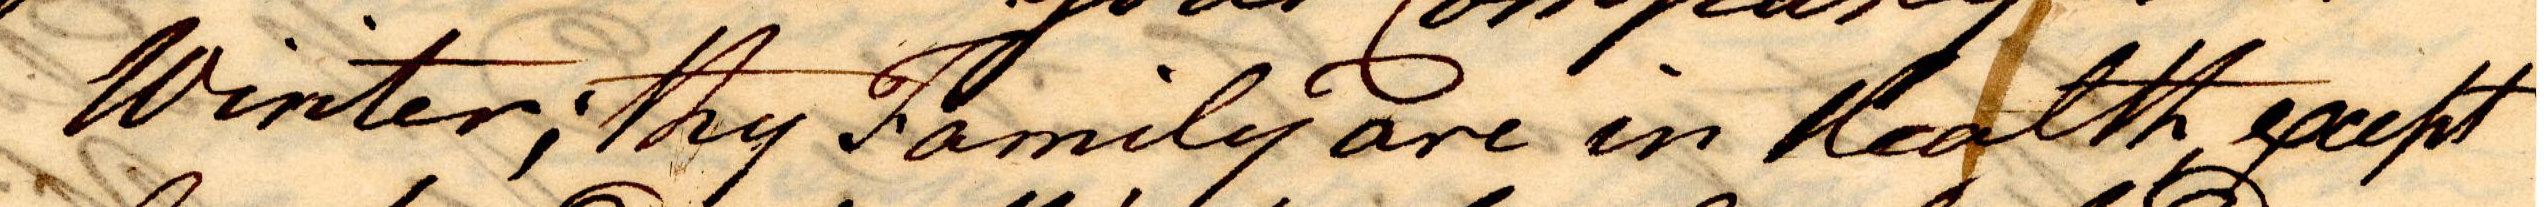Winter; thy Family are in Health except
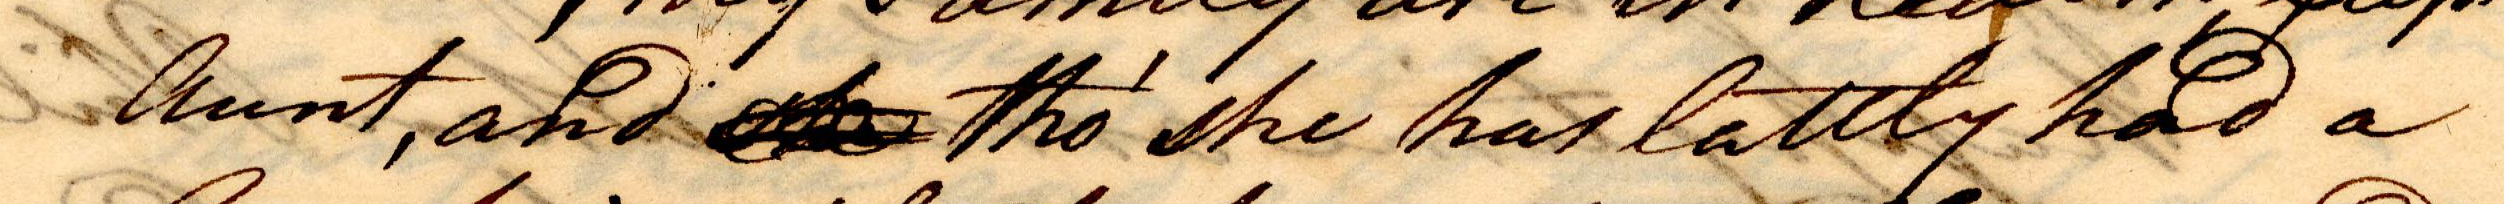Aunt, and [she] tho' she has lattly had a
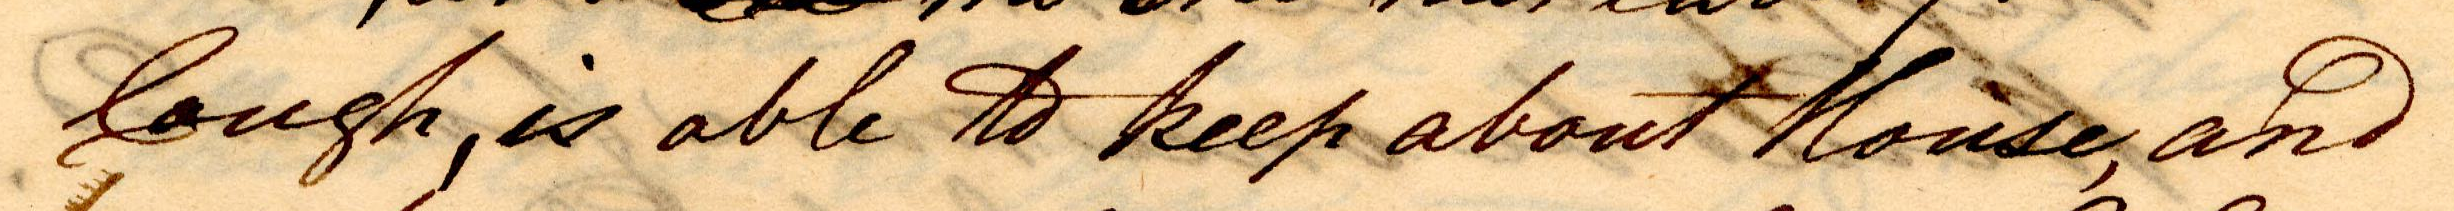Cough, is able to keep about House, and
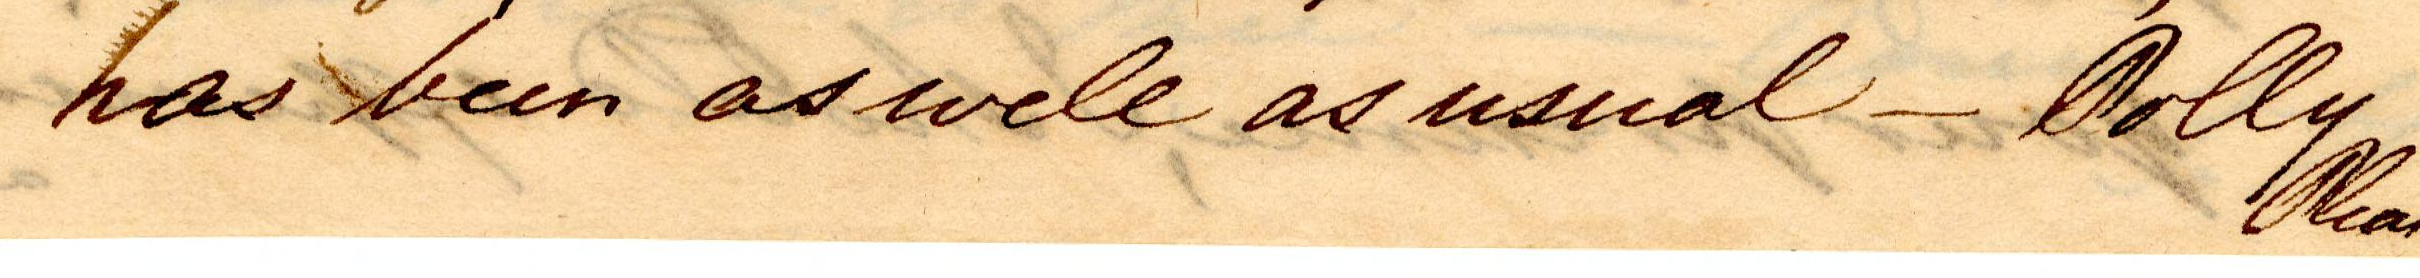has been well as usual- Polly
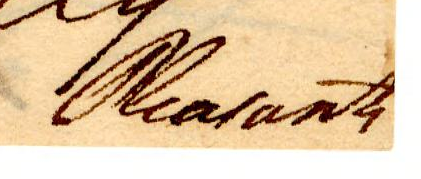Pleasants
